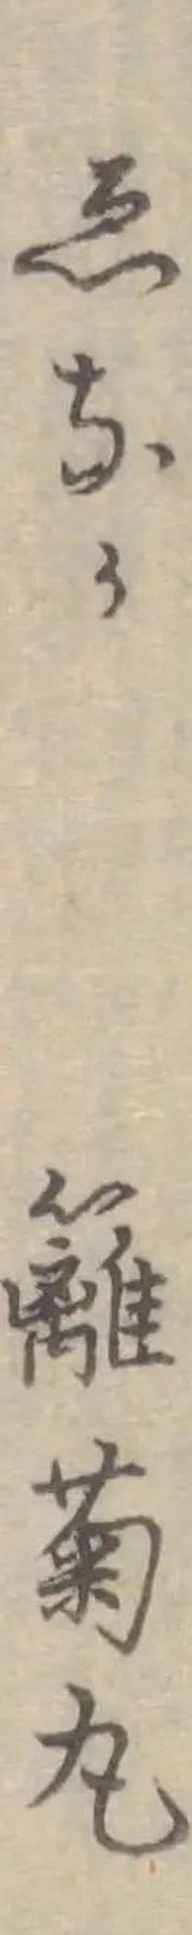ゑなか籬菊丸
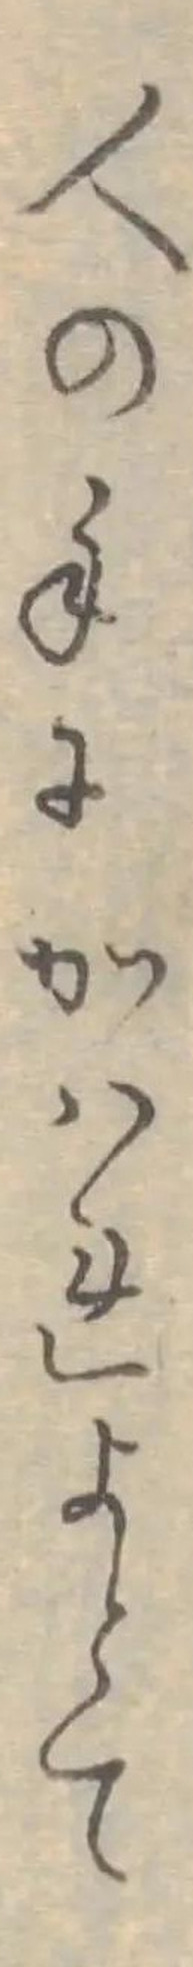人の手にかはれよとて
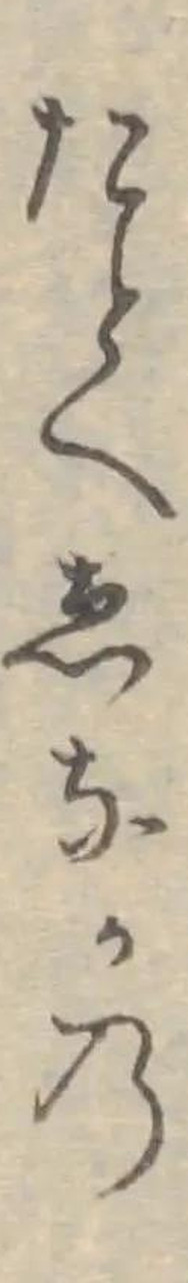たとへゑなかの
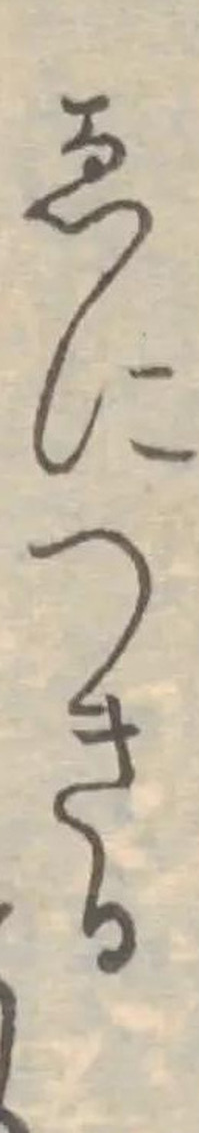ゑにつきる
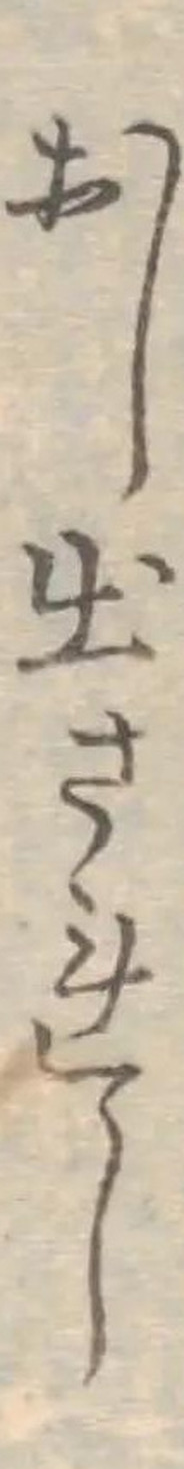おし出されし
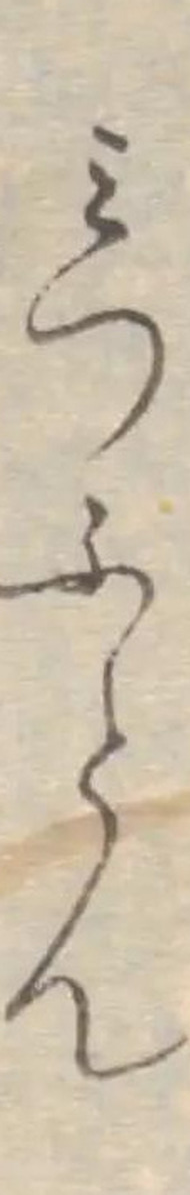みつふとん
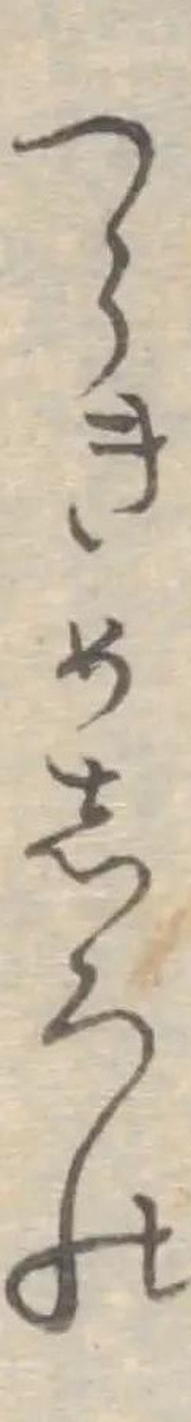つらきめしろの
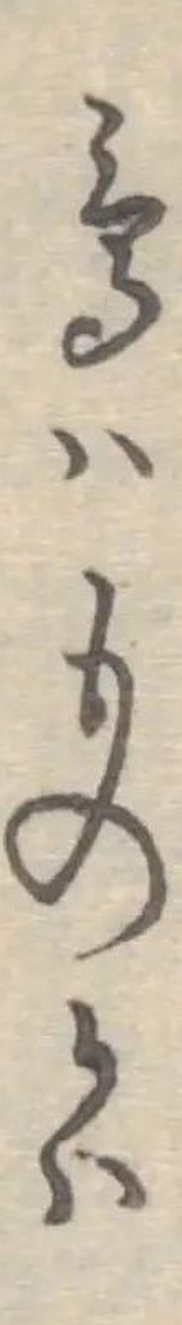鳥はものかは

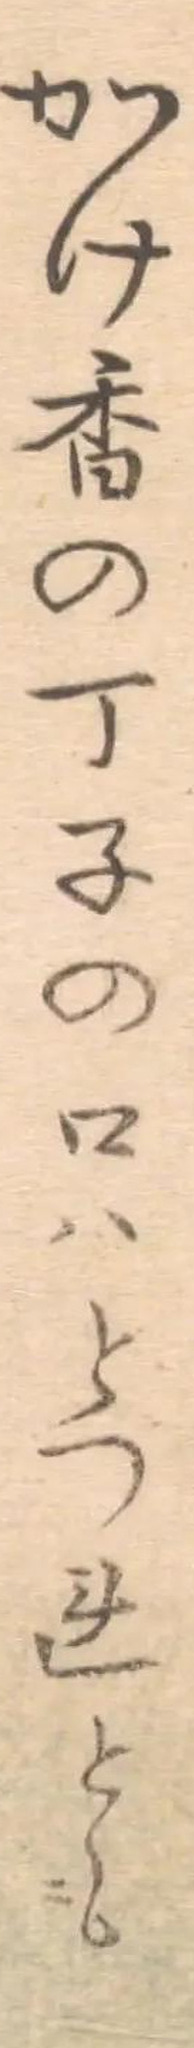かけ香の丁子の口はとつれとも
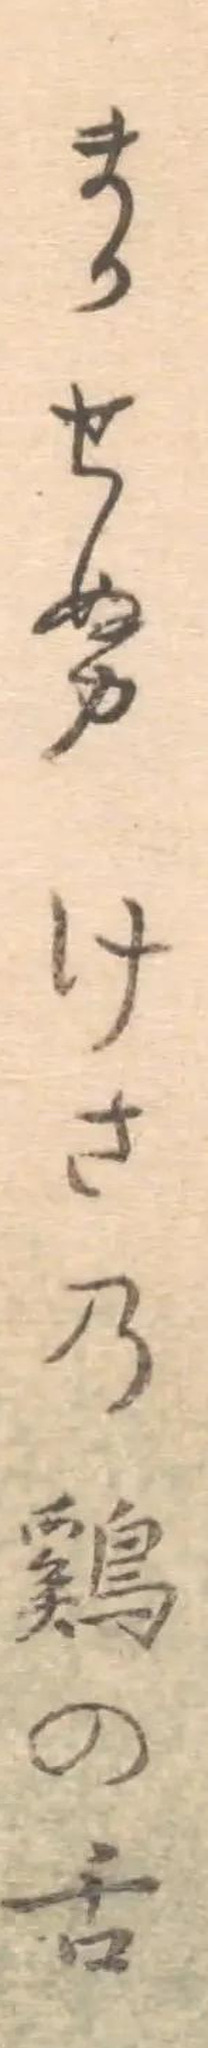まかせぬけさの鶏の舌
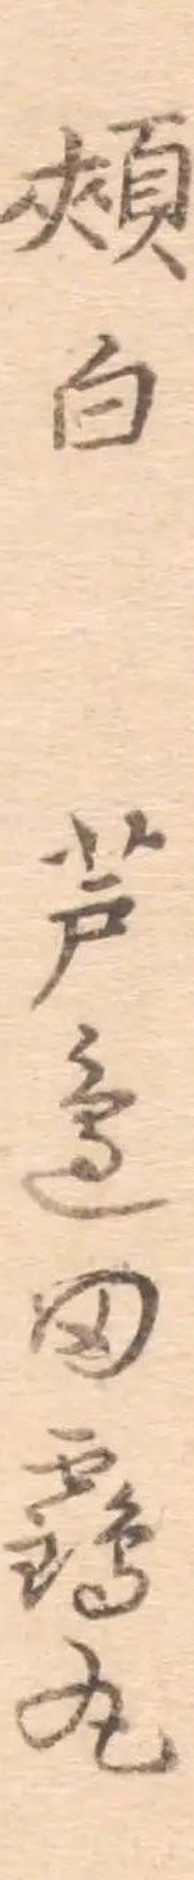頬白芦辺田鶴丸
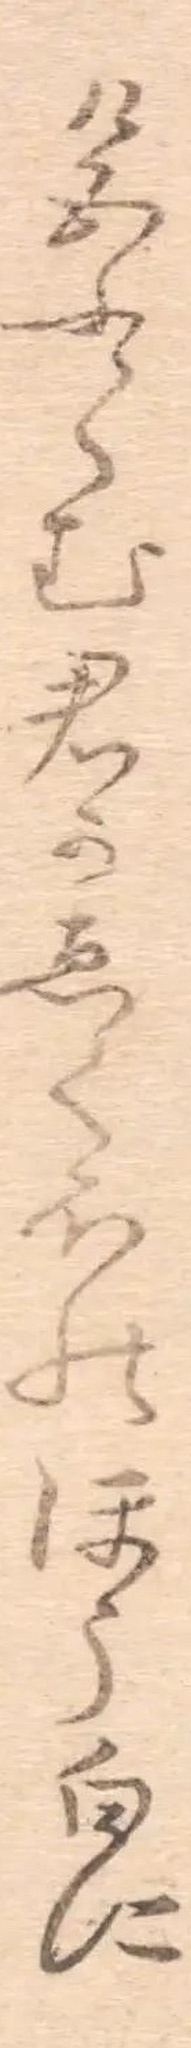色ふくむ君かゑくほのほう白に
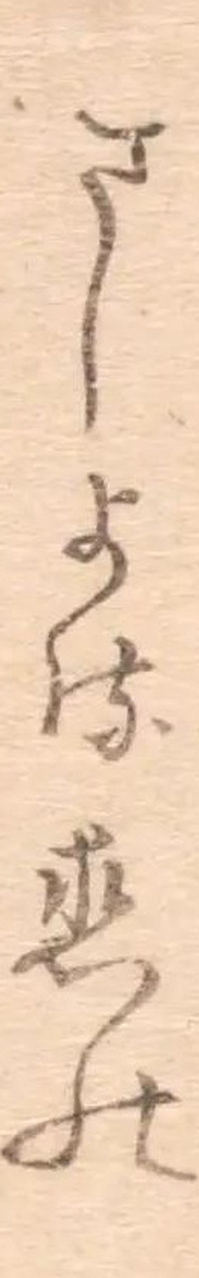さしよる恋の

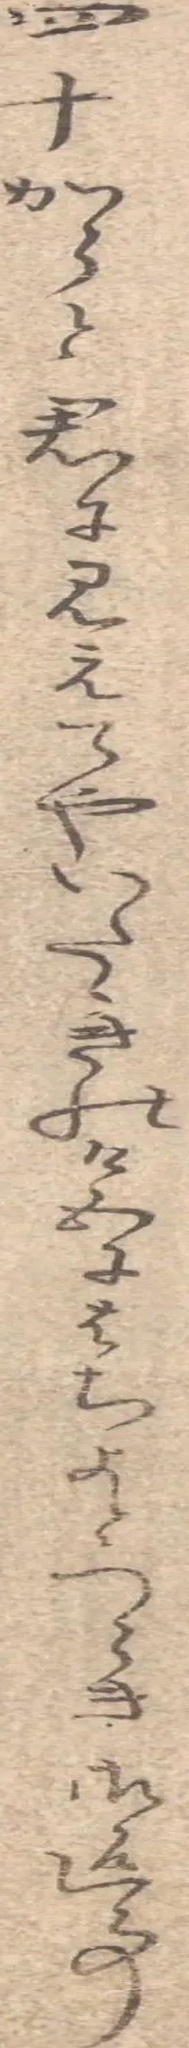四十からと君に見えてやいたゝきの色にはちよとつらき御返事
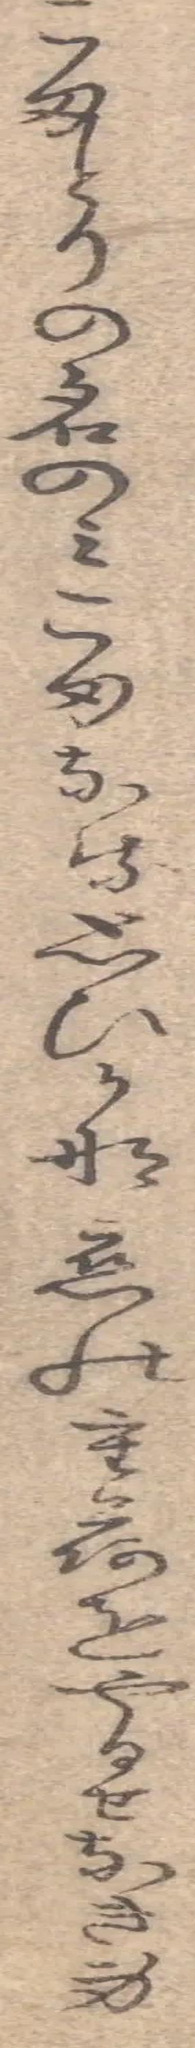こまとりの名のみこまなる思ひかな恋の重荷をやるせなき身
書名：絵本百千鳥. 1
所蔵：国立国会図書館 National Diet Library, JAPAN
